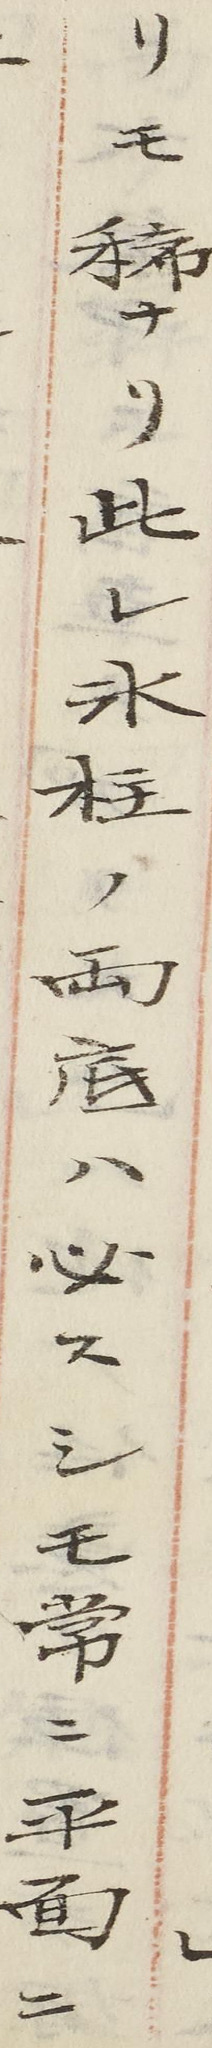リモ稀ナリ此レ氷柱ノ両底ハ必スシモ常ニ平面ニ
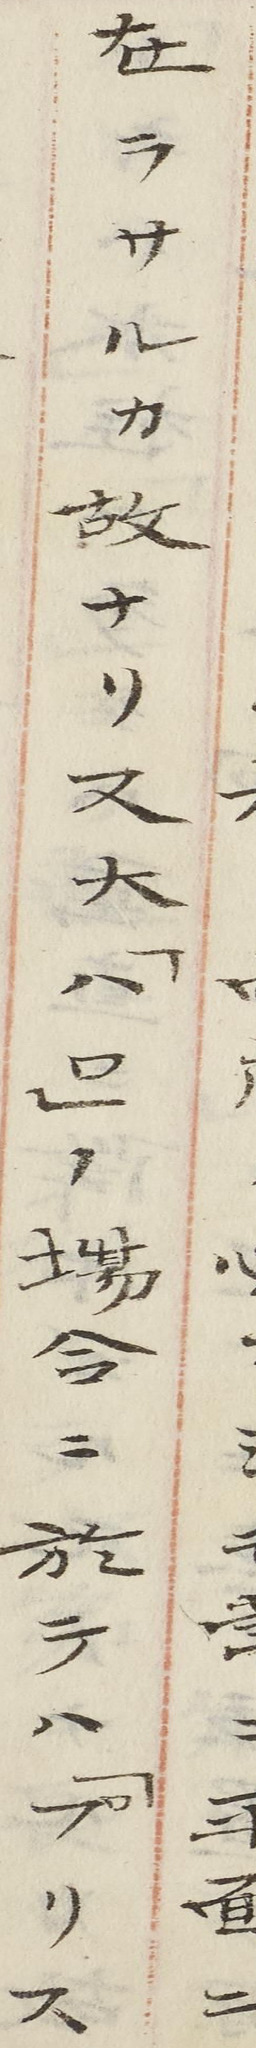在ラサルカ故ナリ又大「ハロ」ノ場合ニ於テハ「プリス
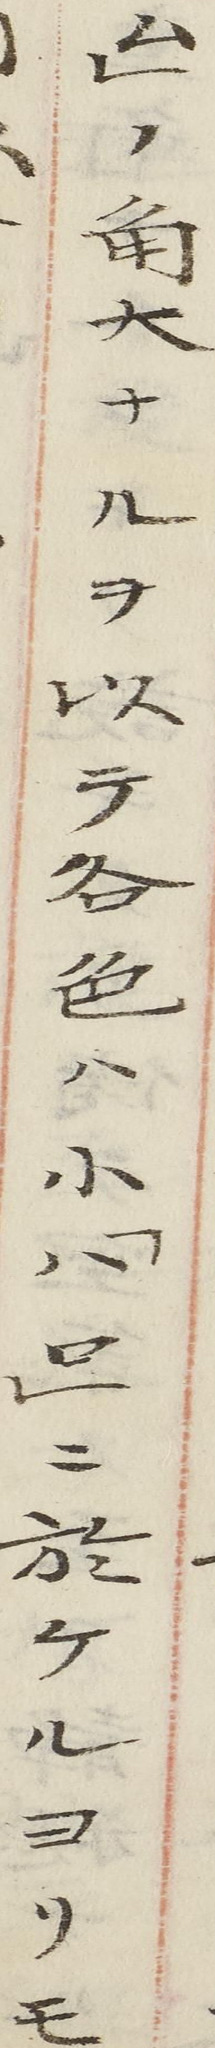ム」ノ角大ナルヲ以テ各色ハ小「ハロ」ニ於ケルヨリモ
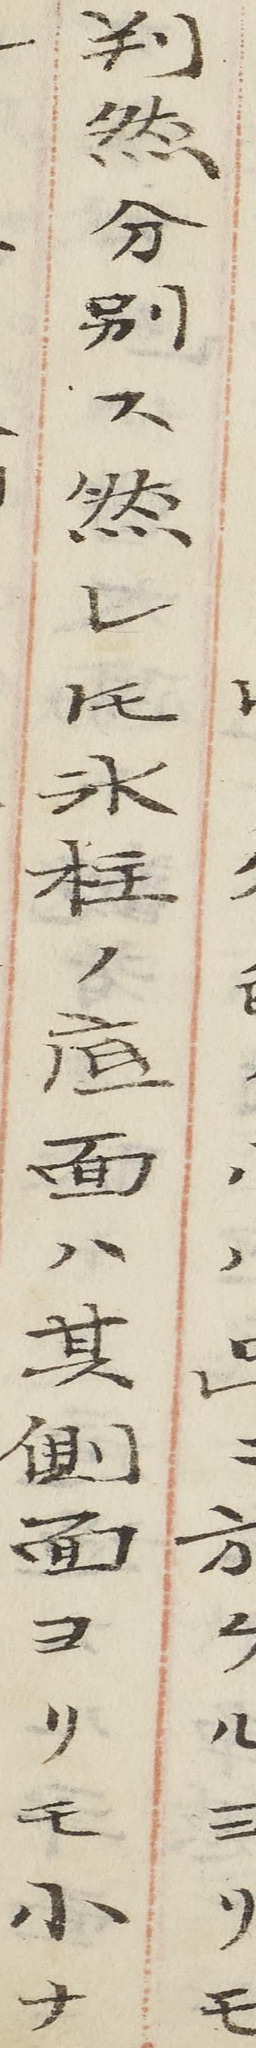判然分別ス然レトモ氷柱ノ底面ハ其側面ヨリモ小ナ
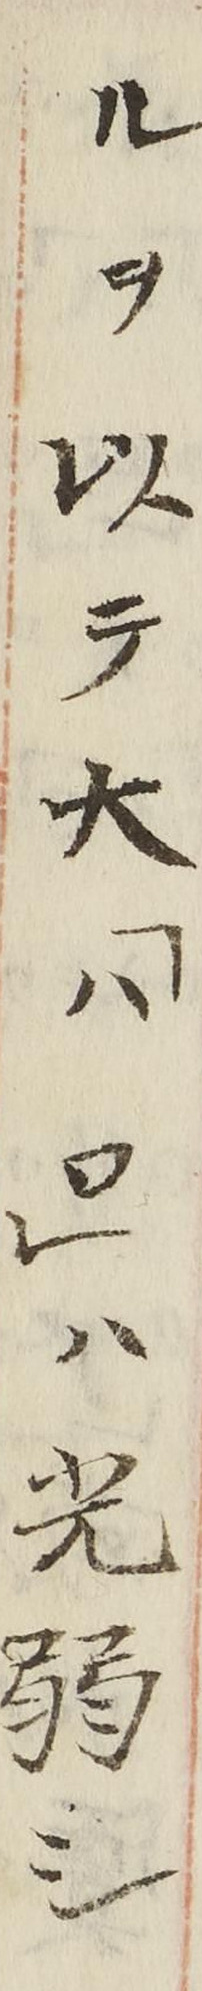ルヲ以テ大「ハロ」ハ光弱シ

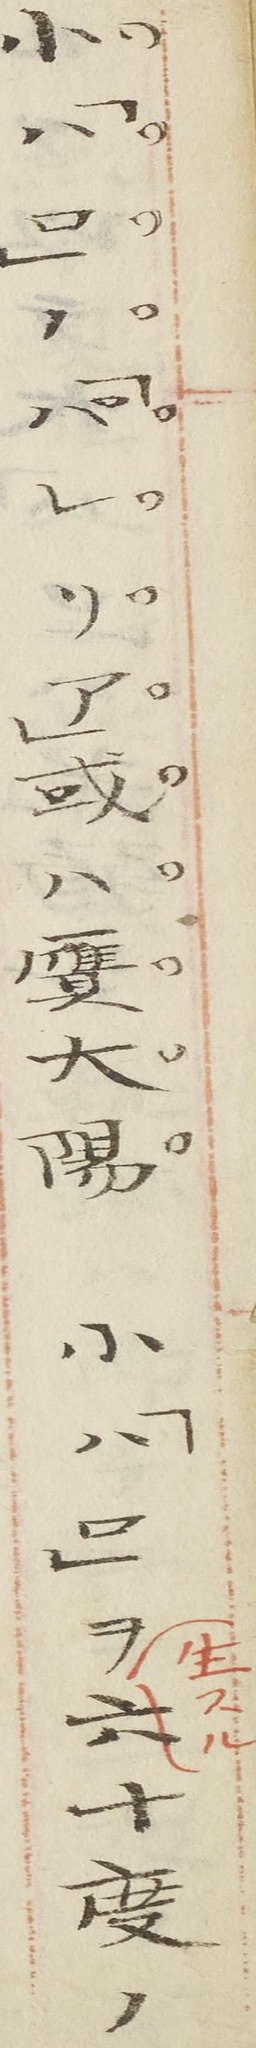小「ハロ」ノ「パレリア」或ハ贋大陽小「ハロ」ヲ六十度ノ
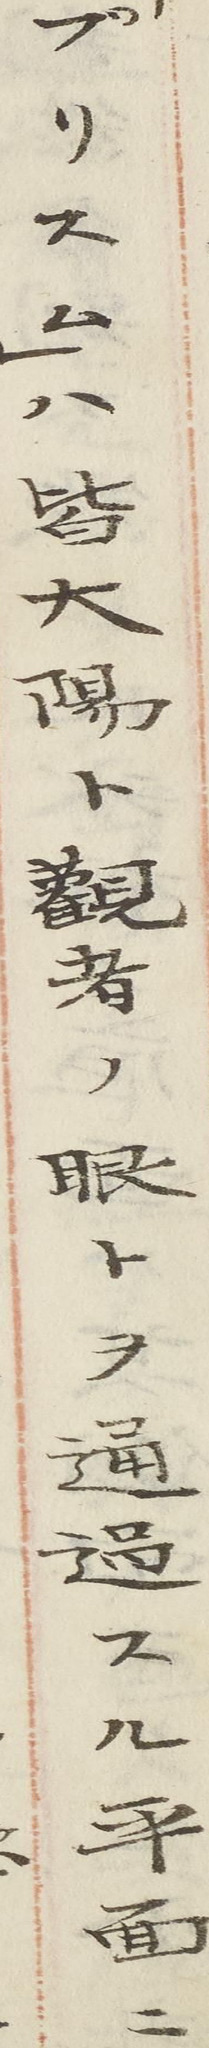「プリスム」ハ皆大陽ト観者ノ眼トヲ通過スル平面ニ
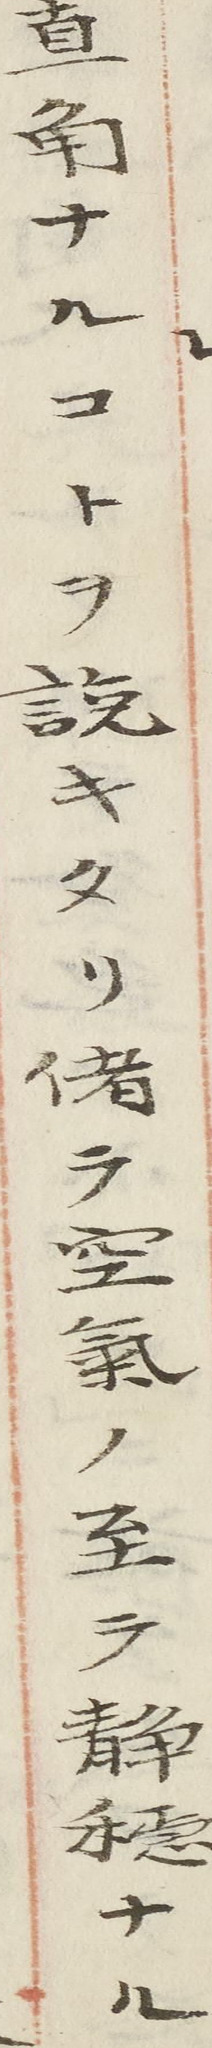直角ナルコトヲ説キタリ偖テ空気ノ至テ静穏ナル
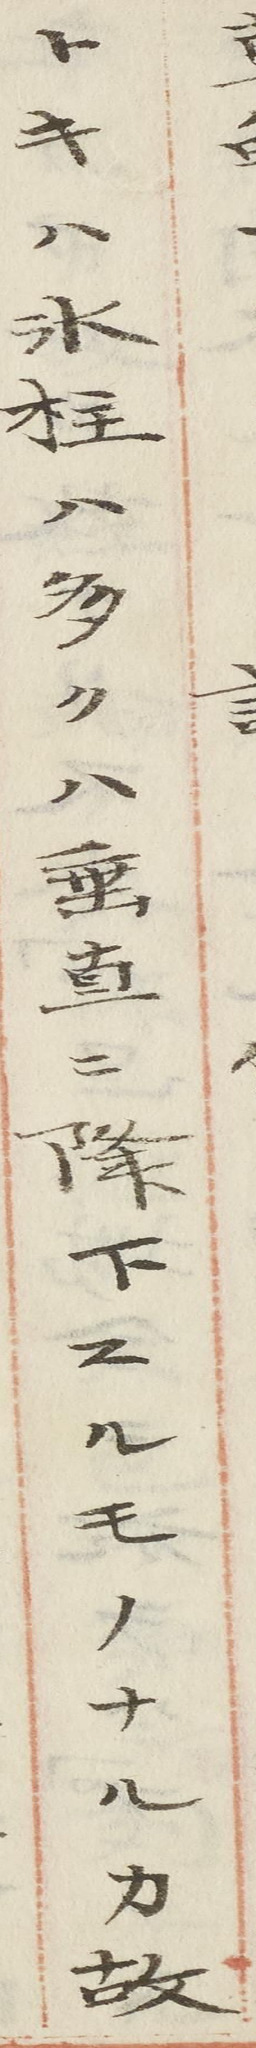トキハ氷柱ハ多クハ垂直ニ降下スルモノナルカ故
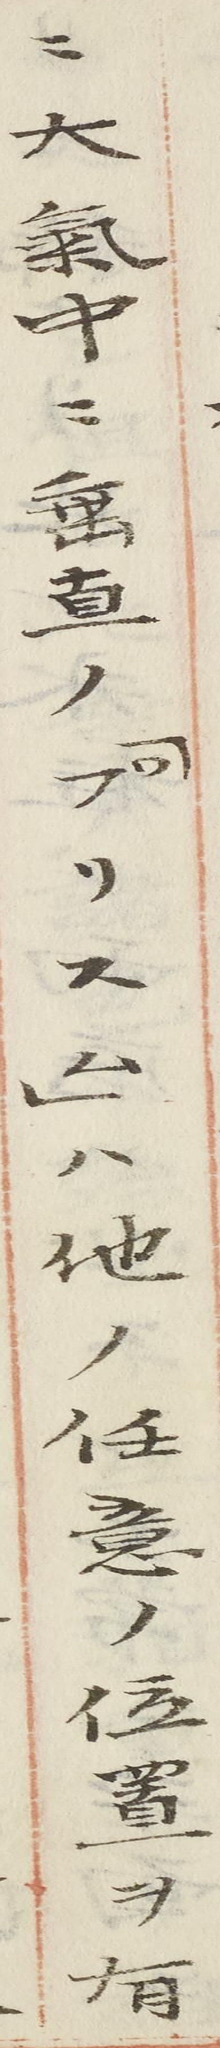ニ大気中ニ垂直ノ「プリスム」ハ他ノ任意ノ位置ヲ有
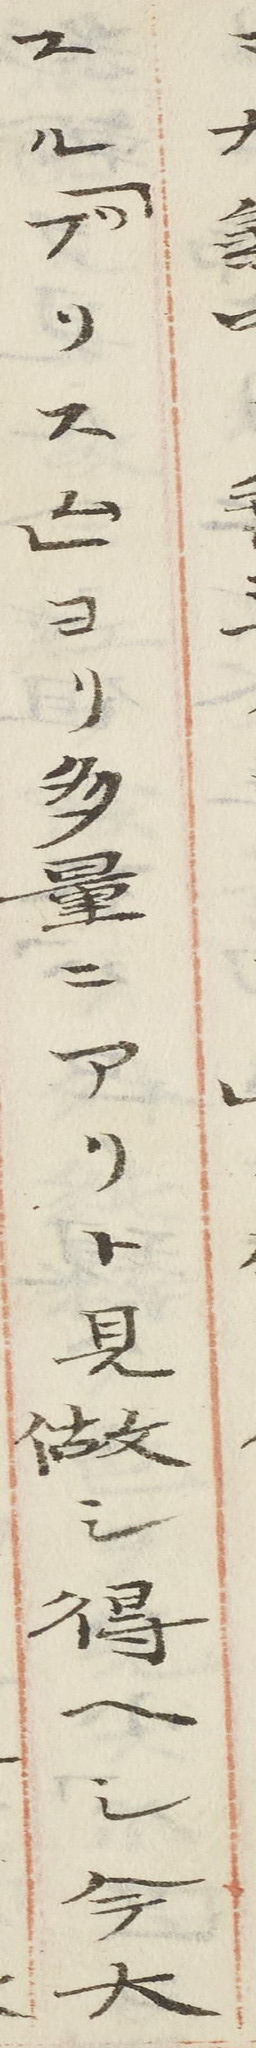スル「プリスム」ヨリ多量ニアリト見做シ得ヘシ今大
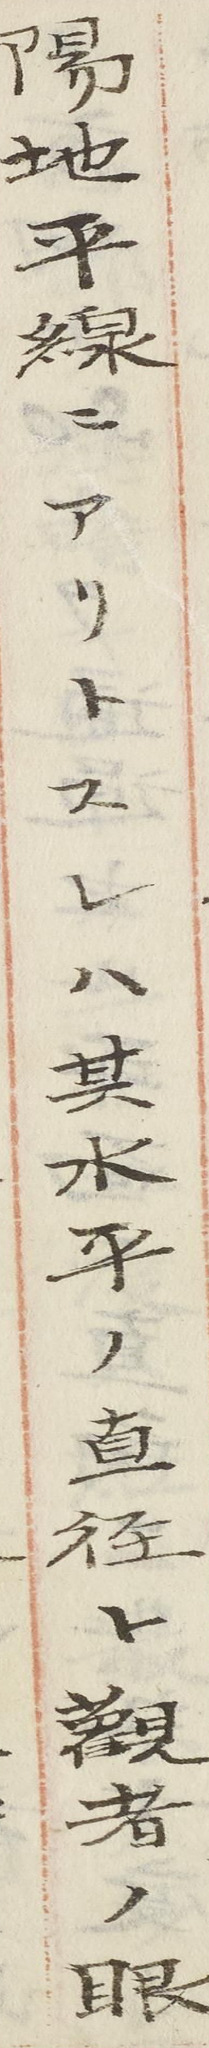陽地平線ニアリトスレハ其水平ノ直径ト観者ノ眼
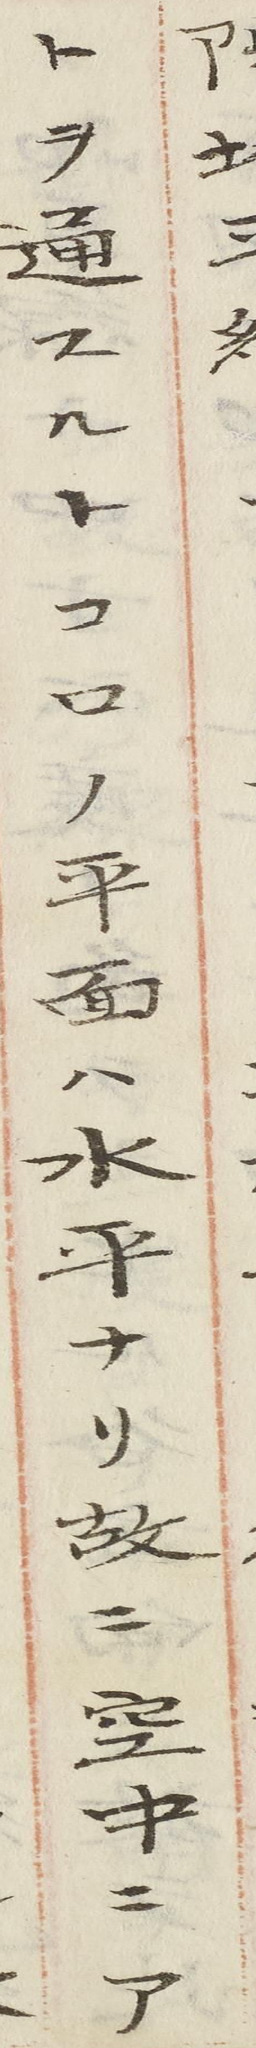トヲ通スルトコロノ平面ハ水平ナリ故ニ空中ニア
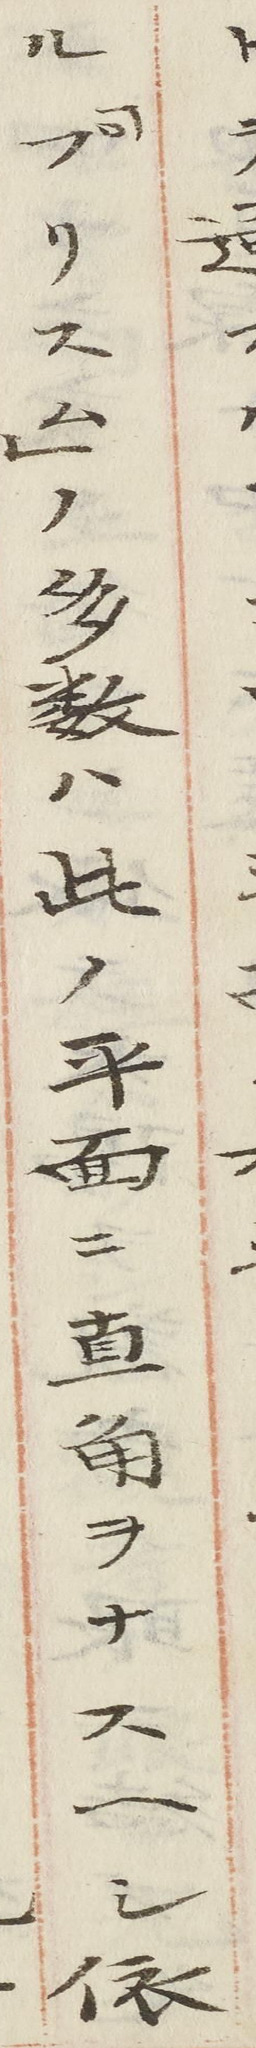ル「プリスム」ノ多数ハ此ノ平面ニ直角ヲナスヘシ依
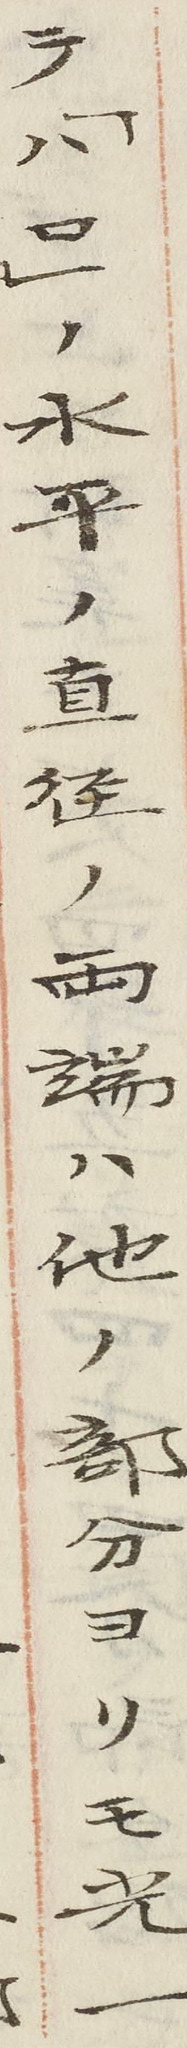テ「ハロ」ノ水平ノ直径ノ両端ハ他ノ部分ヨリモ光一
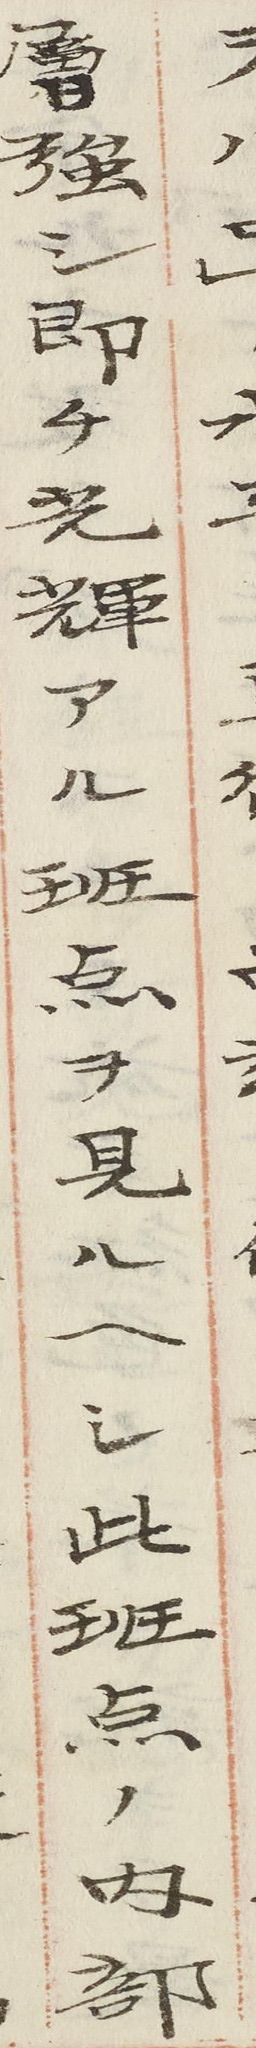層強シ即チ光輝アル斑点ヲ見ルヘシ此斑点ノ内部
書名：虹及ハロノ説明
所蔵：東京大学地震研究所図書室 Earthquake Research Institute Library, The University of Tokyo, JAPAN
